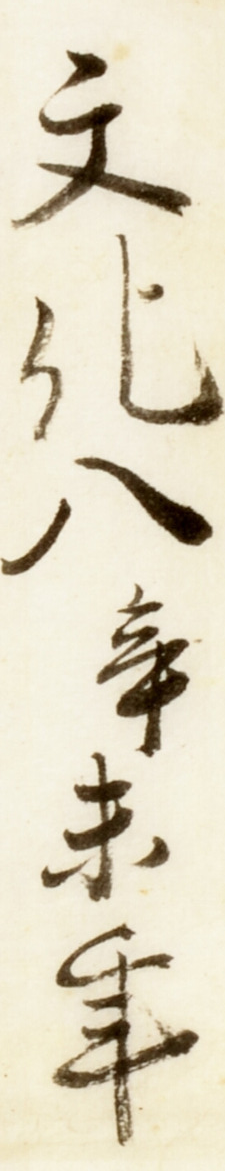文化辛未年
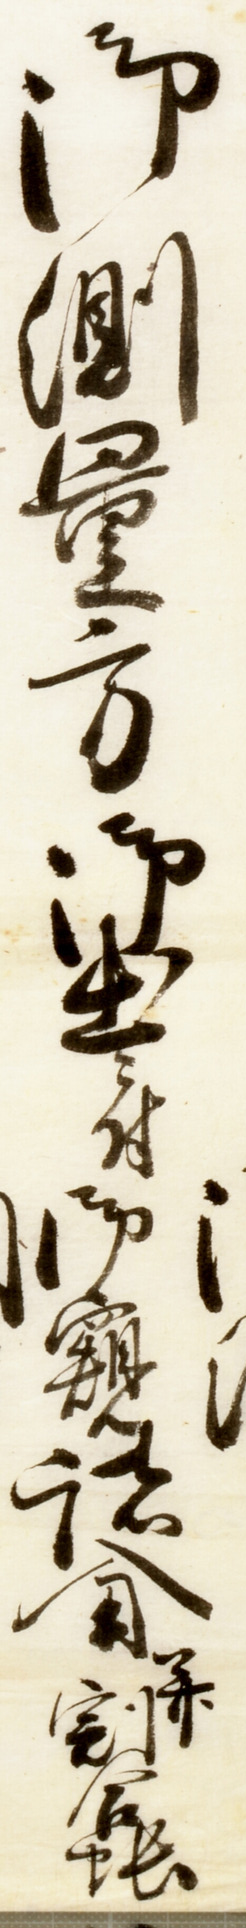御測量方御出ニ付御窺諸入用幷割合帳

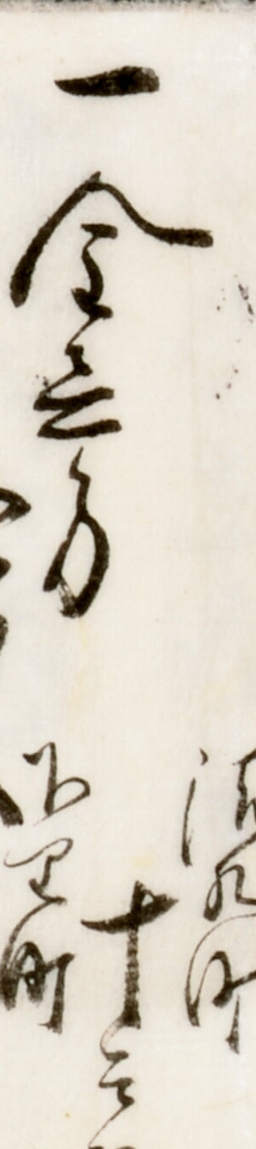一金壱分清水町
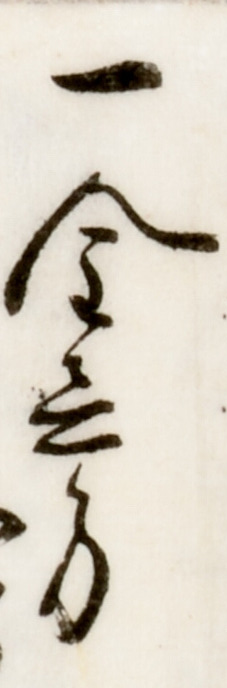一金三分
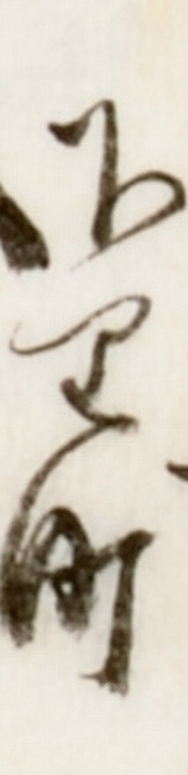下里町
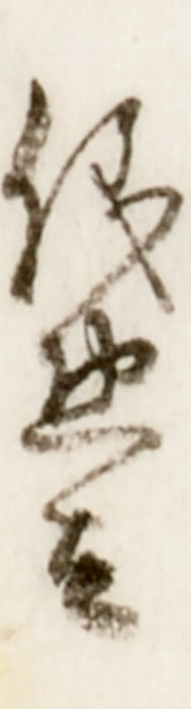儀惣衛
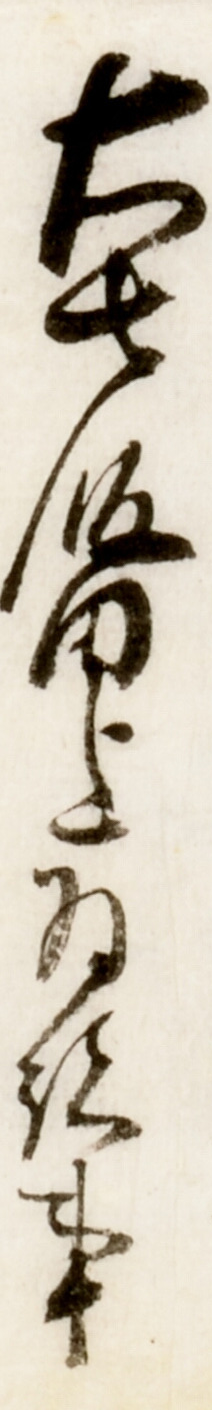右者飯田迄為諸事
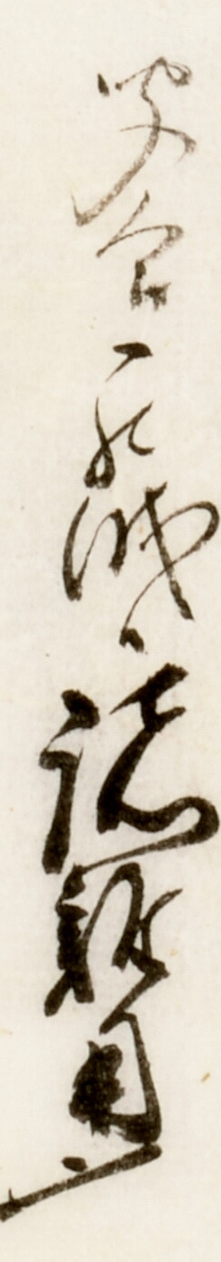聞合罷越候諸雑用〆
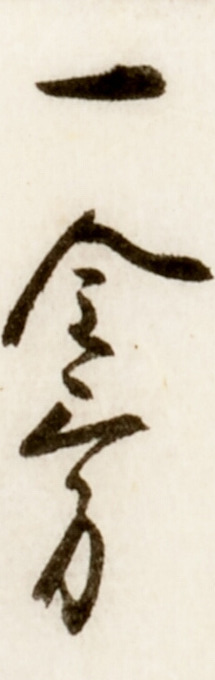一金三分
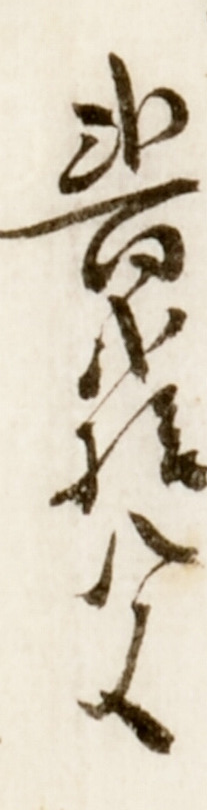弐百弐拾八文
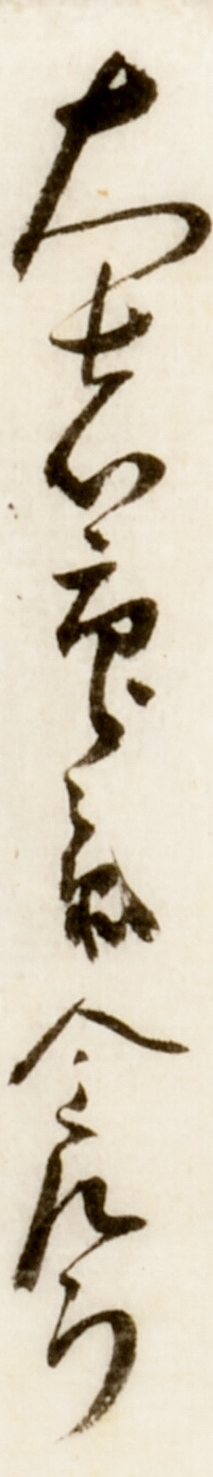右者市郎兵衛金左衛門
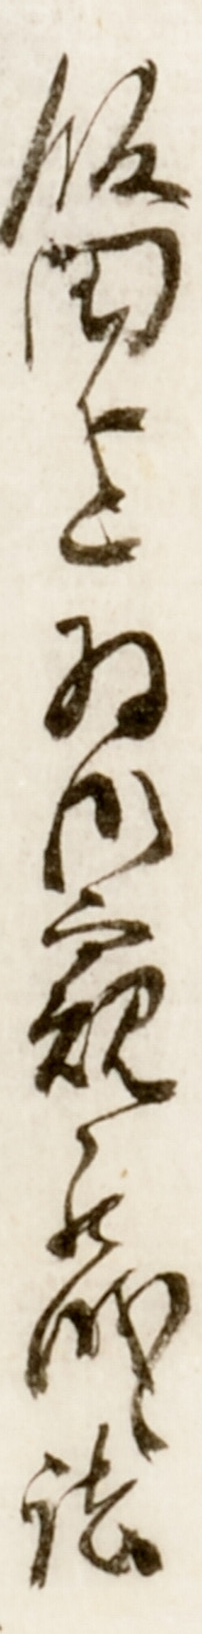飯田迄為御窺罷越候諸
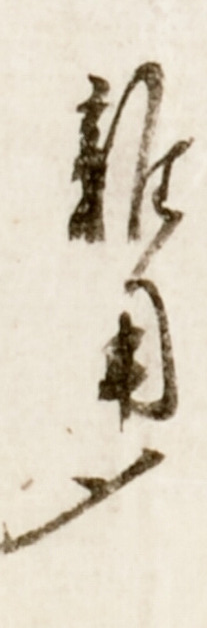雑用〆
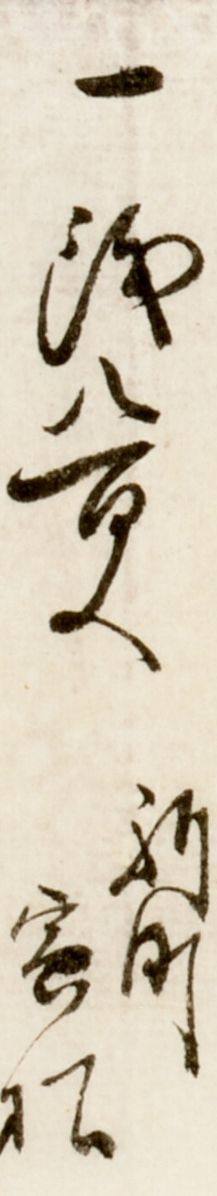一銭八百文新町
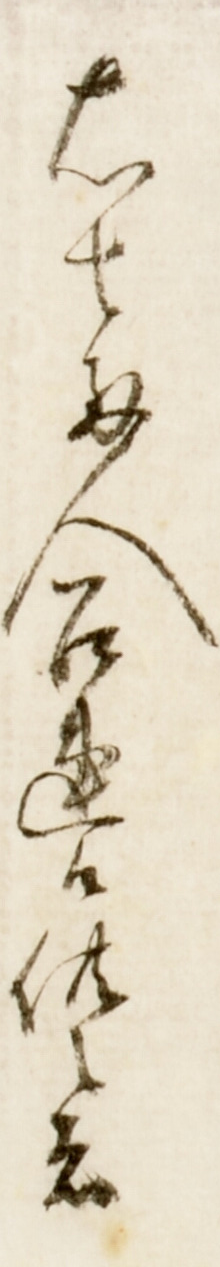右者両人召連候供之者

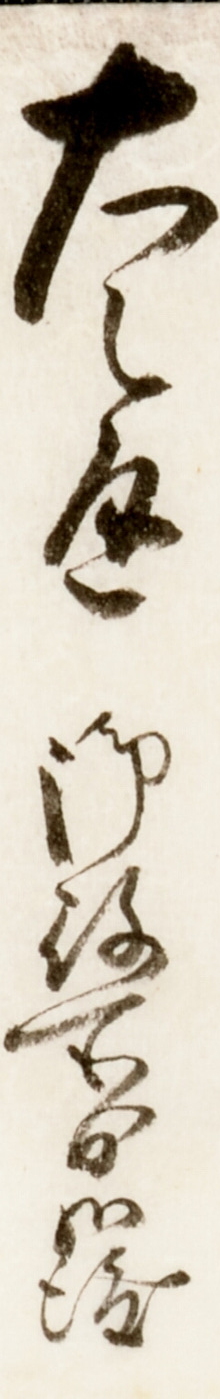右之通御役所ゟ御渡
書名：御泊御窺聞合わせ諸入用割合帳
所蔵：伊那市立高遠町図書館・合同会社AMANE
